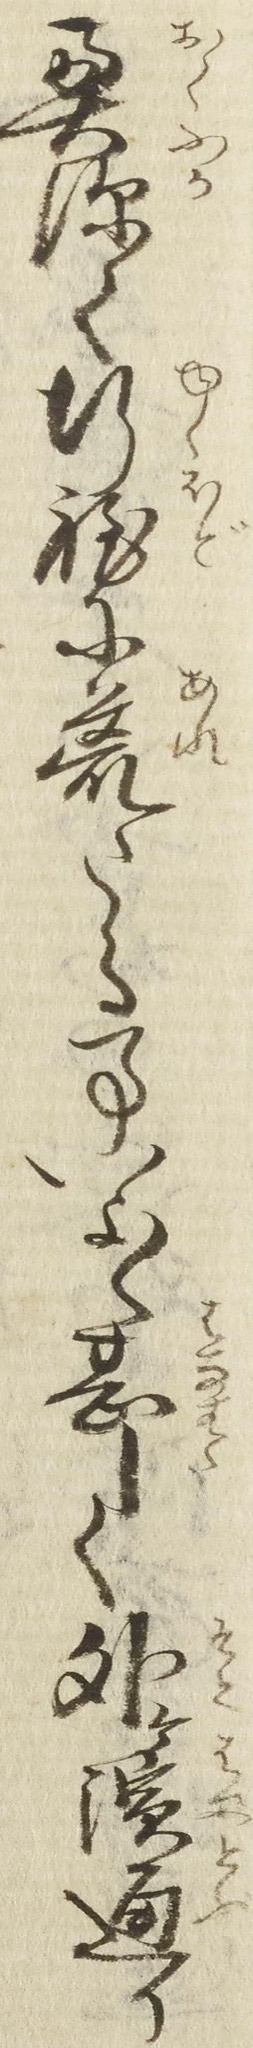奥深く行程に荒たる事いよ〳〵甚しく外ケ浜通り
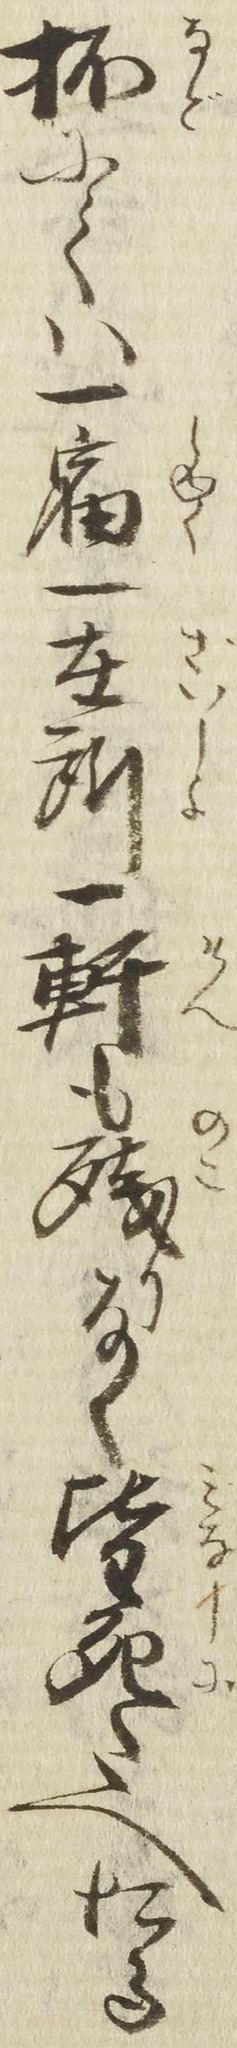抔にては一宿一在所一軒も残りなく皆死たへたる
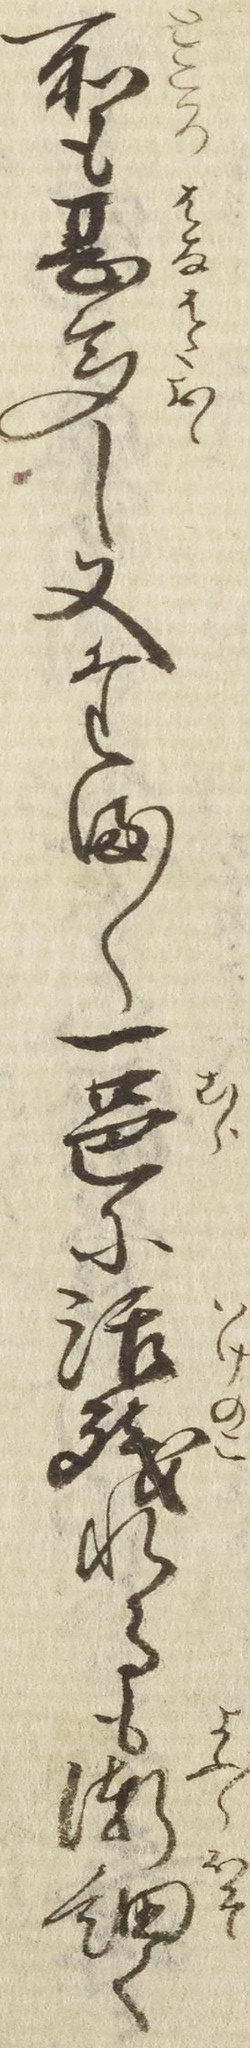所も甚多し又たま〳〵一邑に活残れるも漸細く
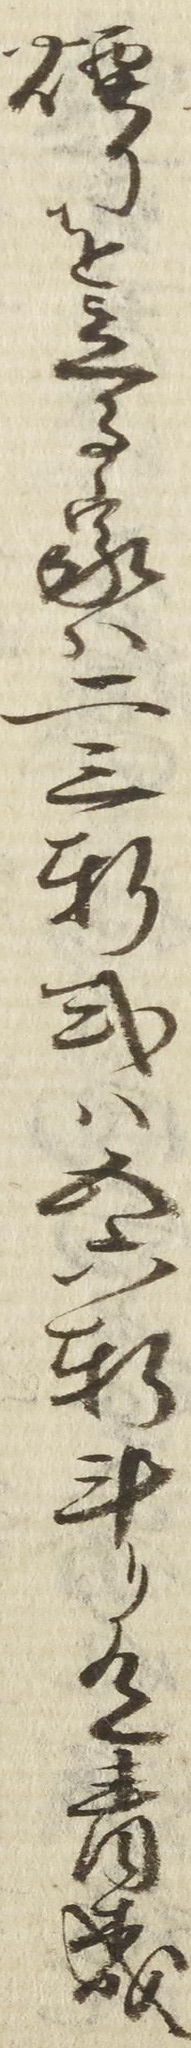煙りを立る家は二三軒或は五六軒斗り有青森
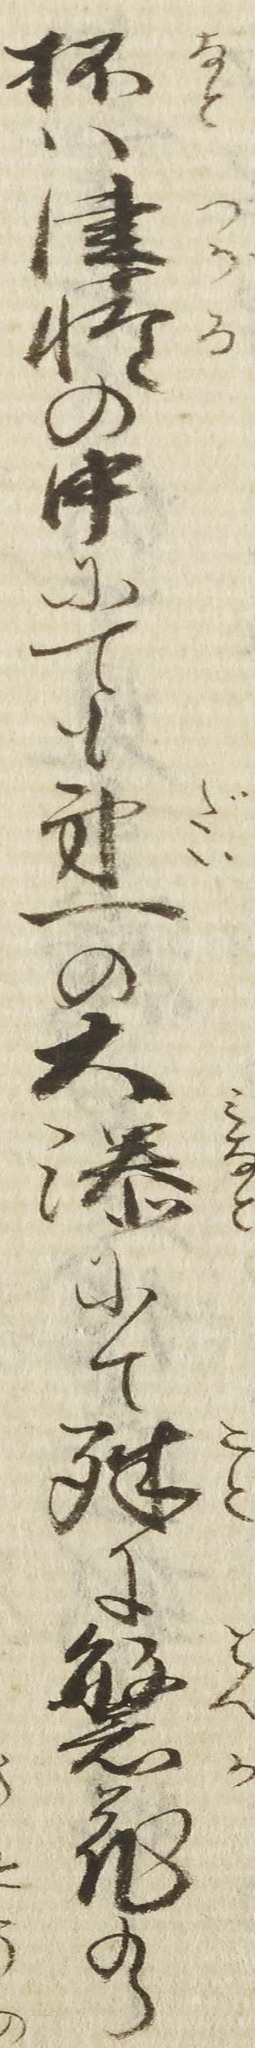抔は津軽の中にても第一の大湊にて殊に繁花の
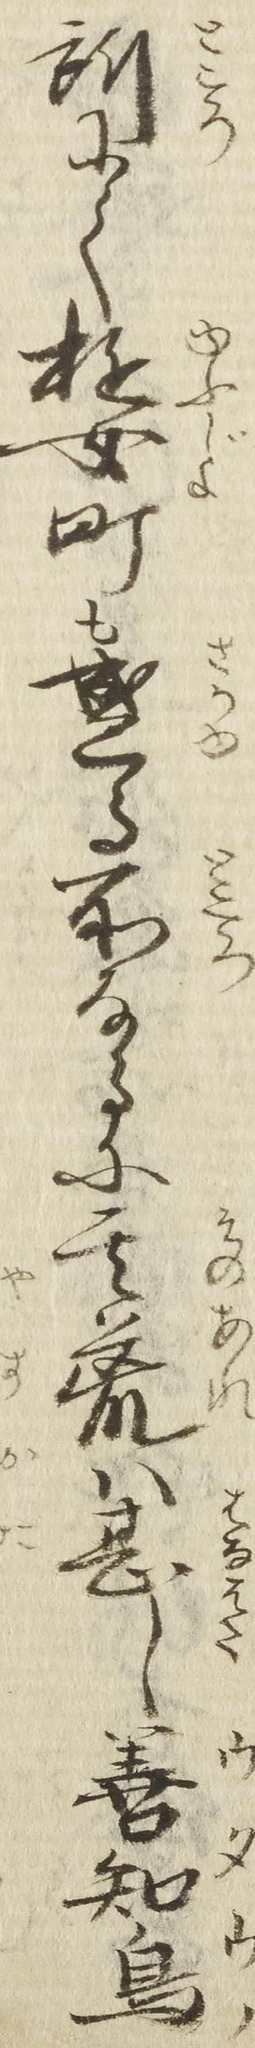所にて遊女町も盛る所なるに其荒は甚し善知鳥
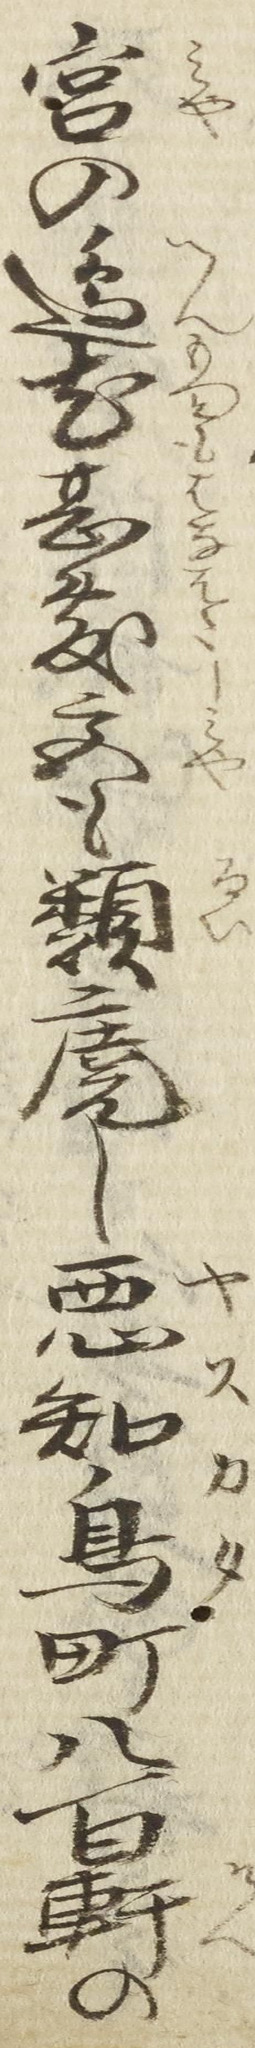宮の辺尤甚敷宮も類廃し悪知鳥町八百軒の

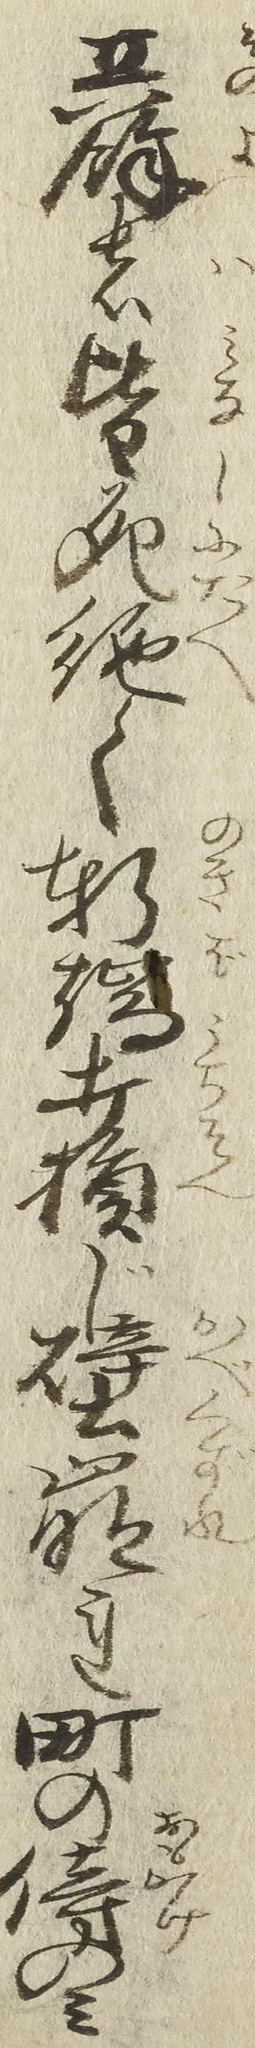其余者皆死絶て軒端打損じ壁崩れ町の侍のみ
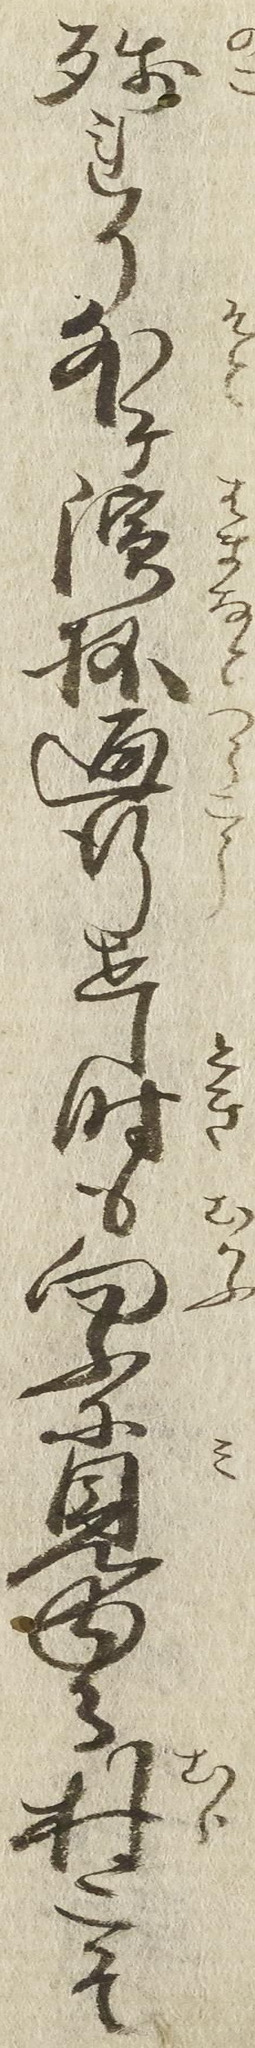残れり外ヶ浜抔通行せし時も向ふに見ゆる村こそ
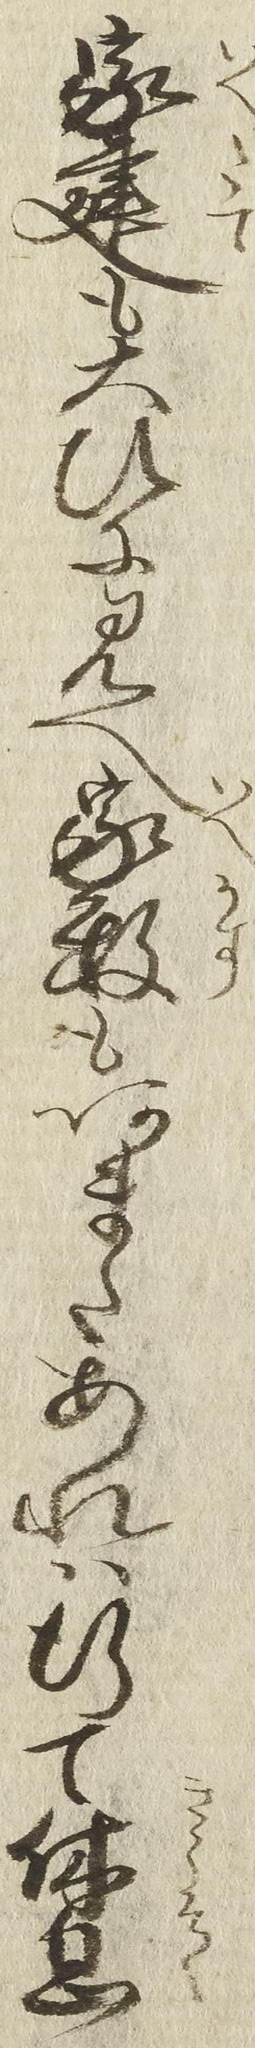家建も大ひに見へ家数もあまたあれは行て休息
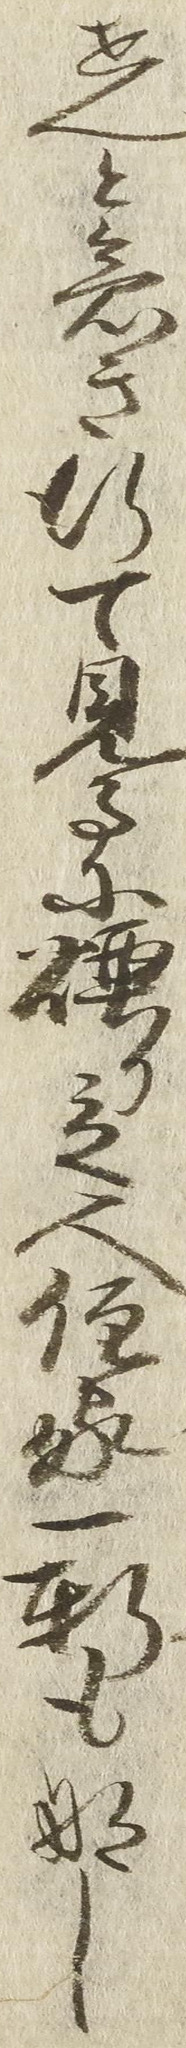せんと急き行て見るに煙り立人住家一軒もなし
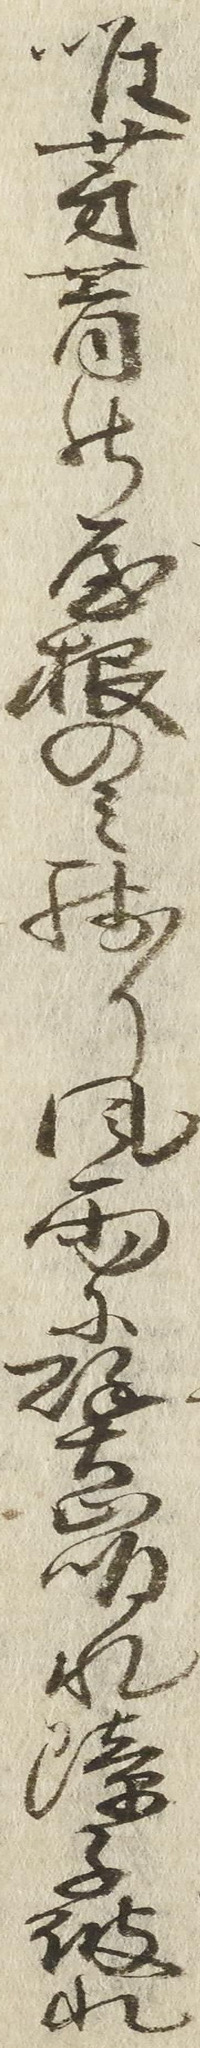唯茅葺の屋根のみ残り風雨に壁崩れ障子破れ
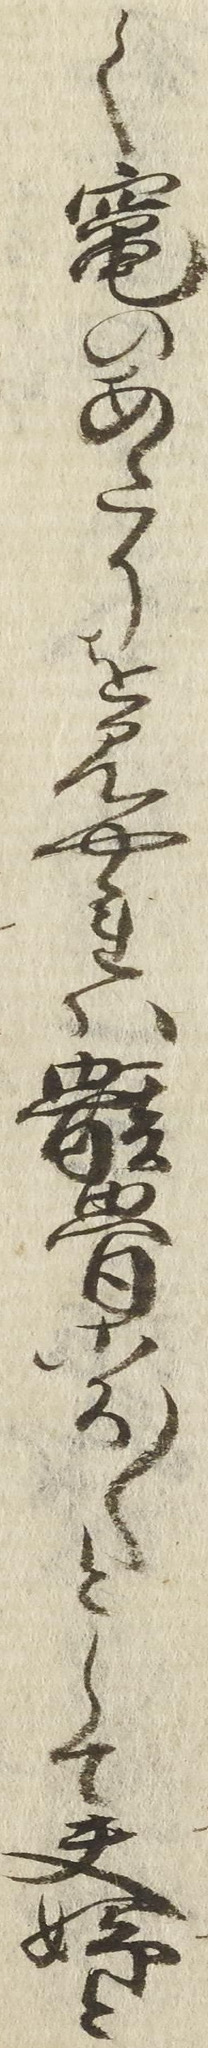て竃のあたりを見やれは骸骨ころ〳〵として夫婦と
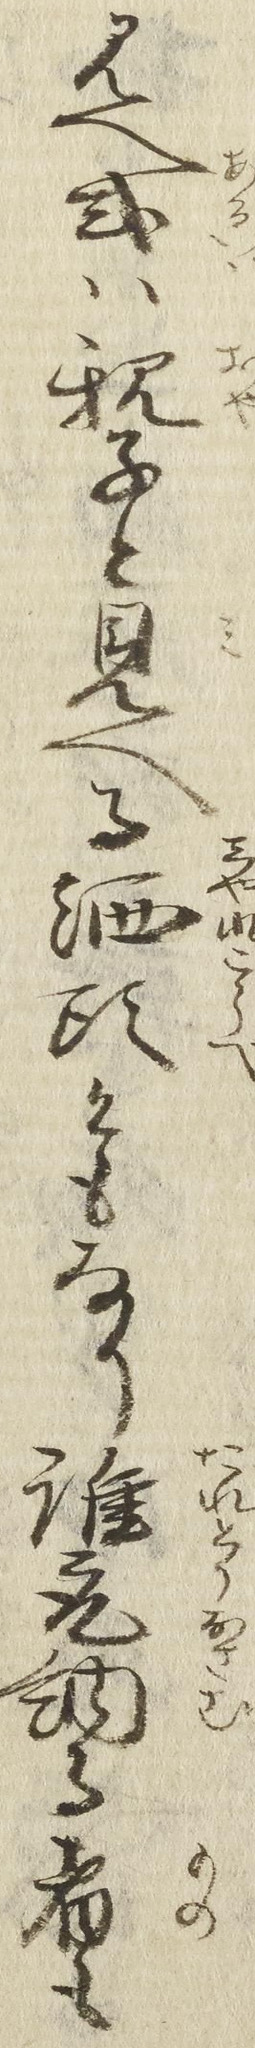見へ或は親子と見へる酒頭ともなり誰取納る者も
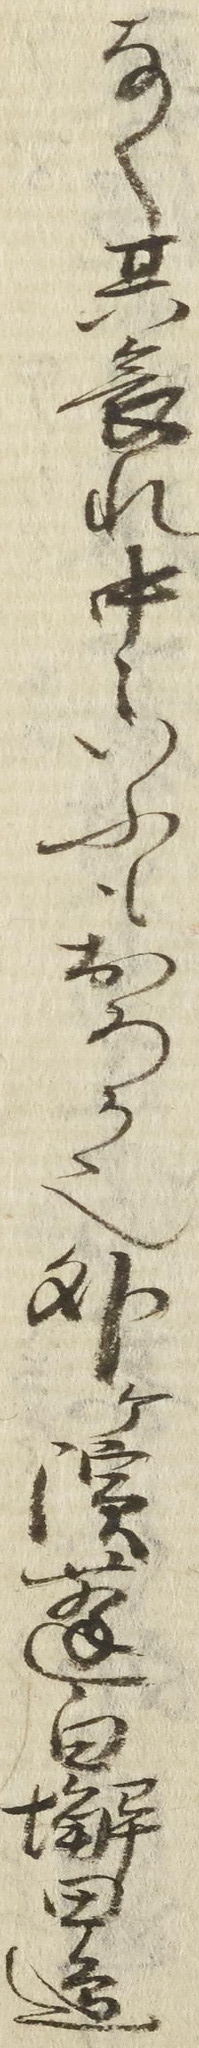なく其哀れ中〻いふもおろか也外ヶ浜蓬白蠏田辺
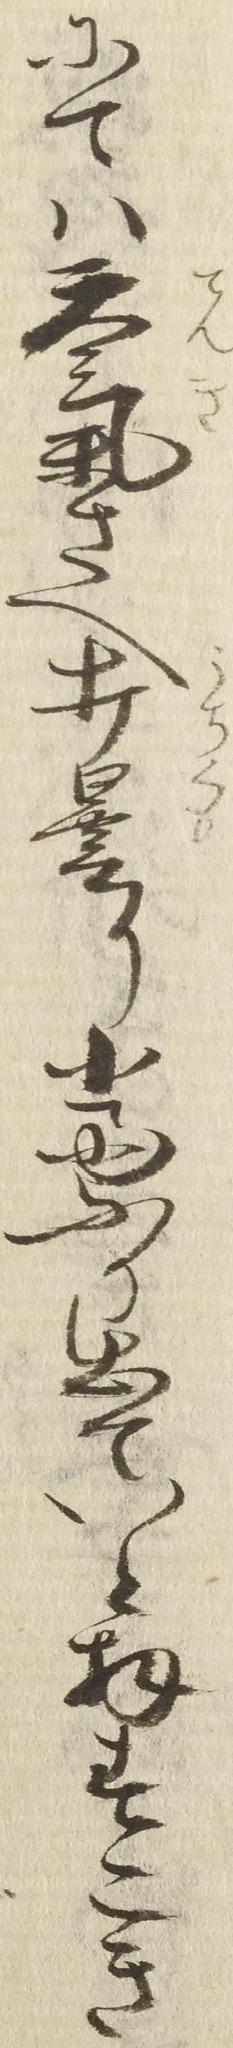にては天気さへ打曇り小雨ふり出ていと物すこき
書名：天明奇畧　全
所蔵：東京大学地震研究所図書室 Earthquake Research Institute Library, The University of Tokyo, JAPAN
